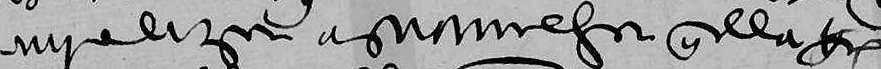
ouujo dizer a sua molher q̄ ella Re p̄sa
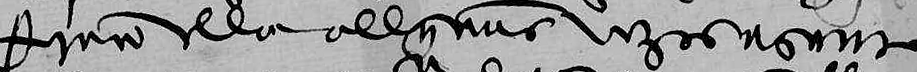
fora c̄o ella allguās vezes a santo
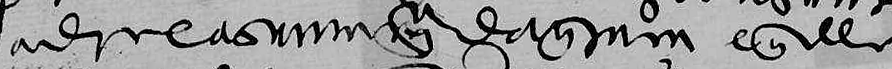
adre e a santa mra da graça e q̄ elle
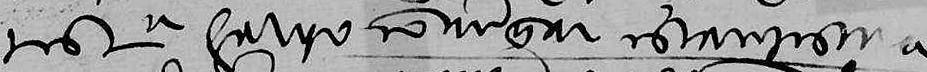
testa ha vyo c̄omūgar esta coresma
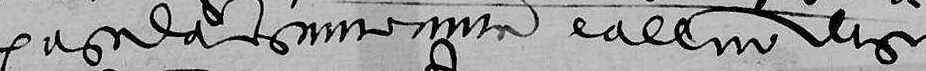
pasada ē santo antā e all n̄o dise
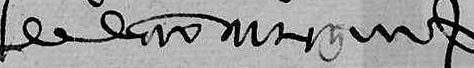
do dito artyguo
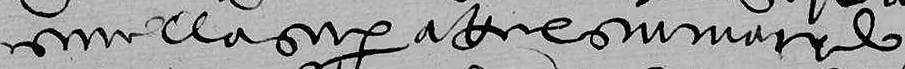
esmolla senꝑ a Ree e seu marydo
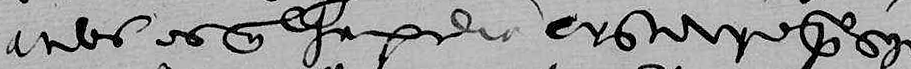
a todos os q̄ lha pediā e ysto vyo p̄o serē
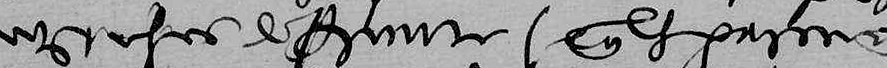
vezynhos de fremte / e q̄ lhe parece q̄
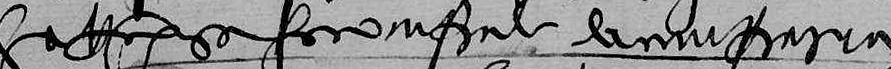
ha Re p̄sa he comfrade da comfrarya
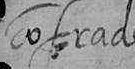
c̄ofrade
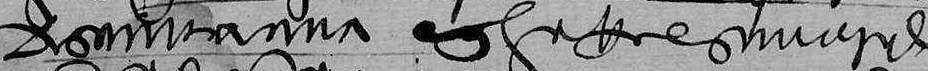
De samtanna e q̄ ha Re e seu marydo
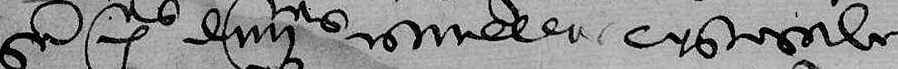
sā pas de mtas esmollas e ysto sabe
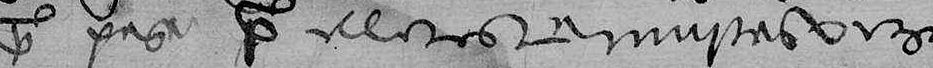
p̄o pasar p̄o elle testa mujtas veze
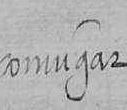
comuḡar
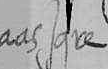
aas Jgre
